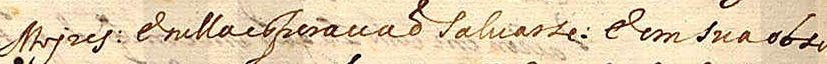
Mojzes: & nella esperauaõ saluarse: & em sua obser
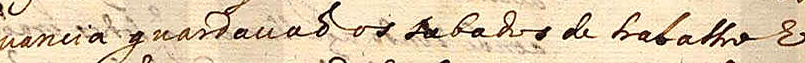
uancia guardauaõ os sabados de trabalho E
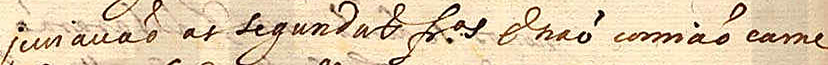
jeiuauaõ as segundas fr.as & naõ comiaõ carne
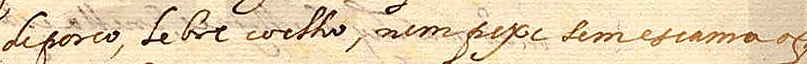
de porco, Lebre coelho, nem pexe sem escama o q̄
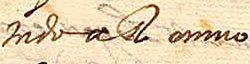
tudo a R ouuio
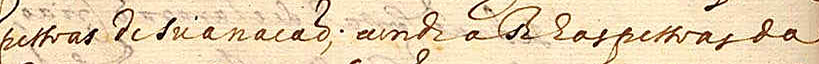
pessoas de sua nacaõ; aonde a R E as pessoas da
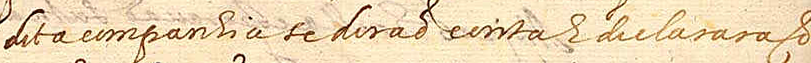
dita companhia se deraõ conta E declararaõ
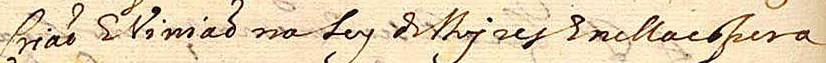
Criaõ E Viuiaõ na Ley de Mojzes E nella espera
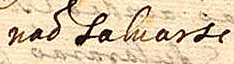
uaõ saluarse
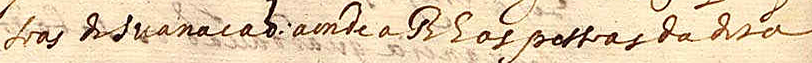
soas de sua nacaõ: aonde a R E as pessoas da dita
